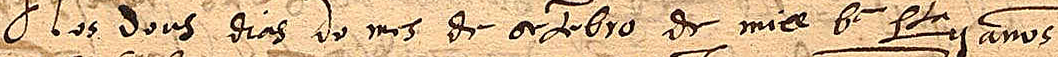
Aos dous dias do mes de set̄ebro de mill bc Lta ij an̄os
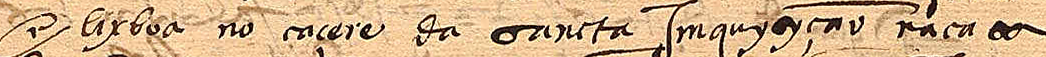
ē lixboa no caçere da sancta Jmquysyção na casa
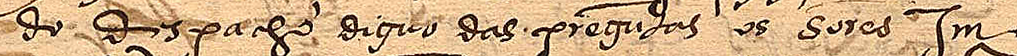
do despacho diguo das prēgutas os Sōres Jm
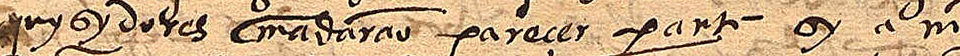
quysydores m̄adarão pareçer ꝑante sy a ma
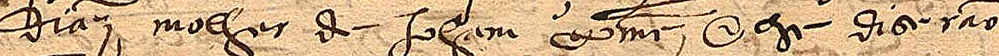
diaz molher de Joham gomez e lhe diserão
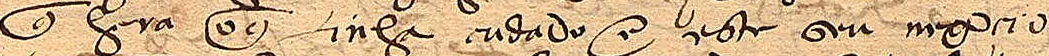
q̄ hera o q̄ tinha cudado ē este seu negoçio
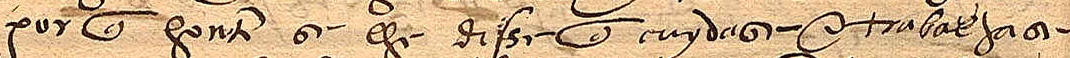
porq̄ hontē se lhe disse q̄ cuydase e trabalhase
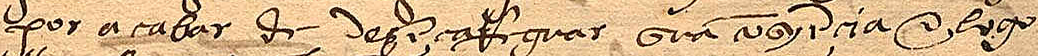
por acabar de dezēcaReguar sua c̄osyēçia e logo
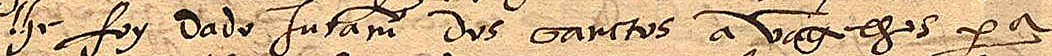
lhe foy dado Juramto dos sanctos avāgelhos ꝑa
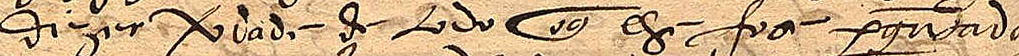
dizer ꝟdade de todo o q̄ lhe fose ꝑḡutado
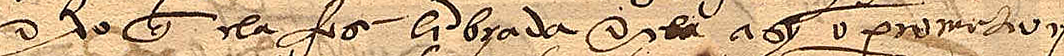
e do q̄ ela fose lēbrada e ela asy o prometeo cꝭ
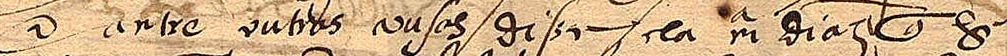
e antre outras cousas / disse / ela ma diaz q̄ he
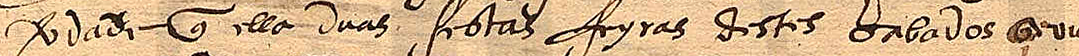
ꝟdade q̄ ella duas sestas feyras destes sabados çeou
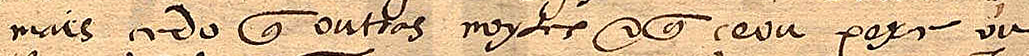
mais çedo q̄ outras noytes e q̄ çeou pexe ou
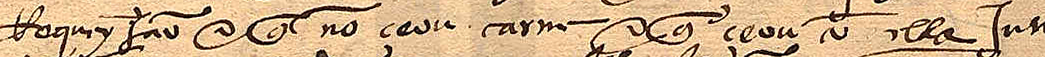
RequeyJão e q̄ n̄o çeou carne e q̄ çeou c̄o ella Jun
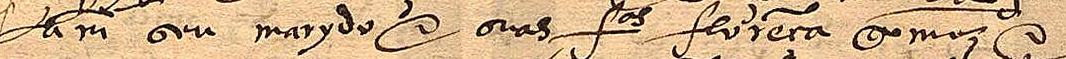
tamte seu marydo e suas fas florēça gomez e
